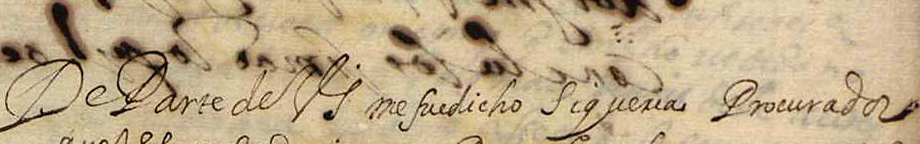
De Parte de V S me fue dicho si queria Procurador
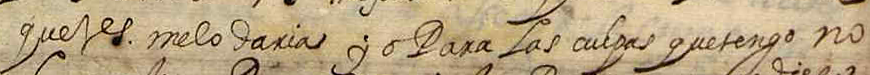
que V s. me lo daria yo Para las culpas que tengo no
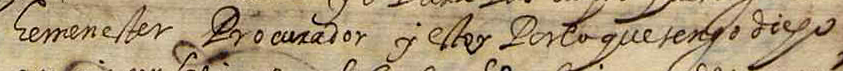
he menester Procurador y estoy Por lo que tengo dicho
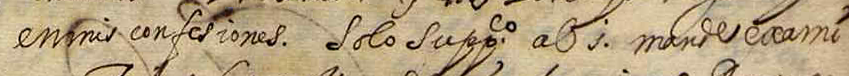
en mis confesiones. Solo Supp.co a V s. mande exami
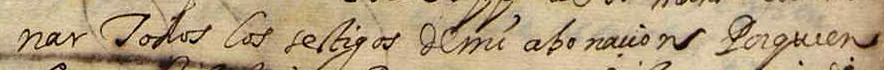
nar Todos los testigos de mi abonacion Por quien
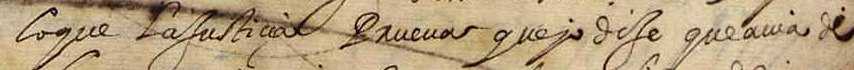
lo que da Justicia Prueua que jo diJe que auia di
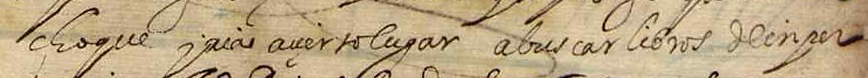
cho que jria a certo lugar a buscar libros de inpor
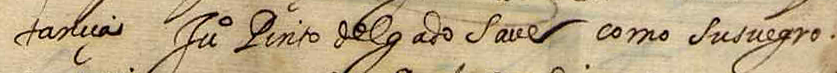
tancia Juo Pinto delgado saue como su suegro
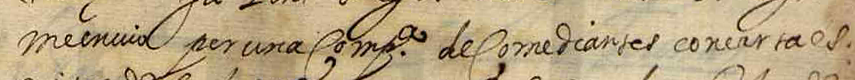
me enuia per una Comp.a de Comediantes con carta es
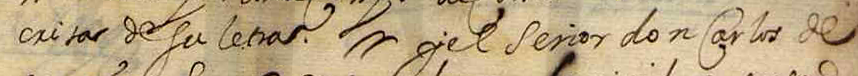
crita de su letra // y el senor don Carlos de
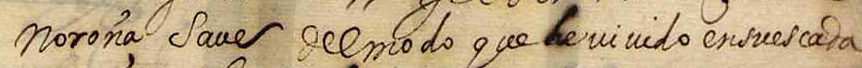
noroña Saue del modo que he uiuido en su escada
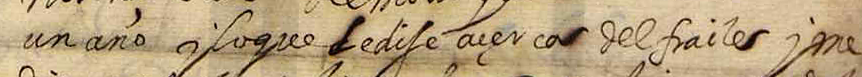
un año y lo que le diJe acerca del fraile j me
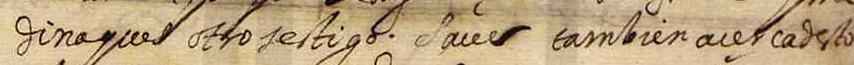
dina ques otro testigo Saue tambien acerca desto
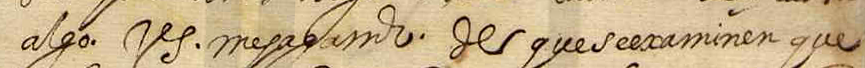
algo V S. me haga md. de que se examinen que
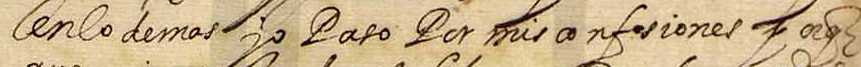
en lo demas yo Paso Por mis confesiones porq̄
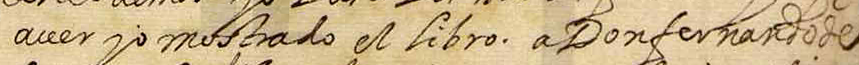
auer jo mostrado el libro. a Don fernando de
